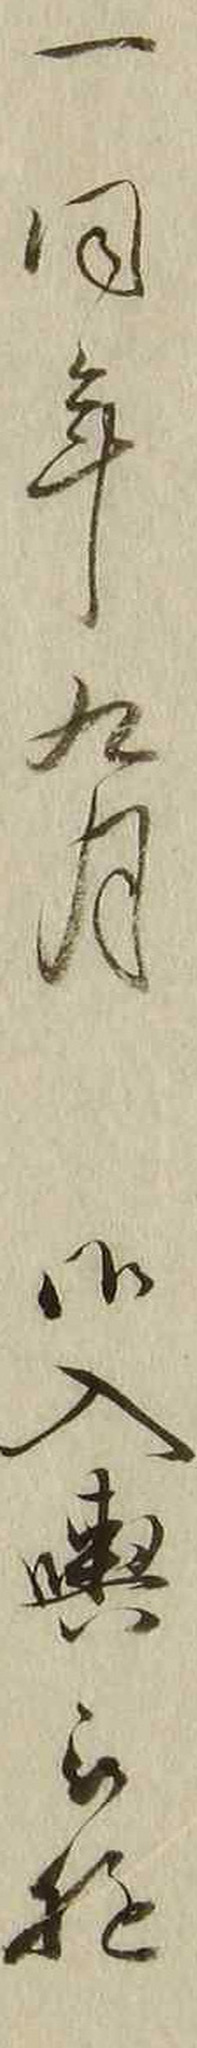一同年九月御入輿被遊
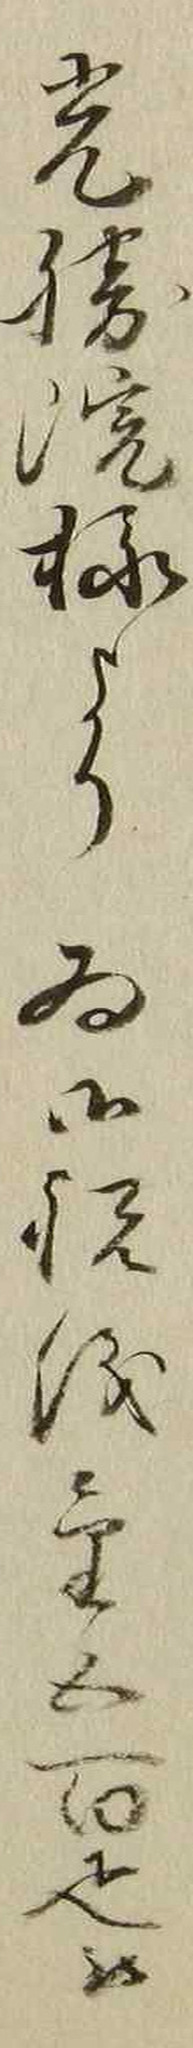光勝院様より為御祝儀金五百疋被
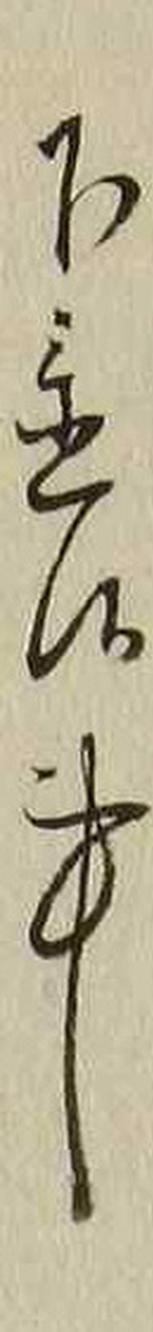下置候事
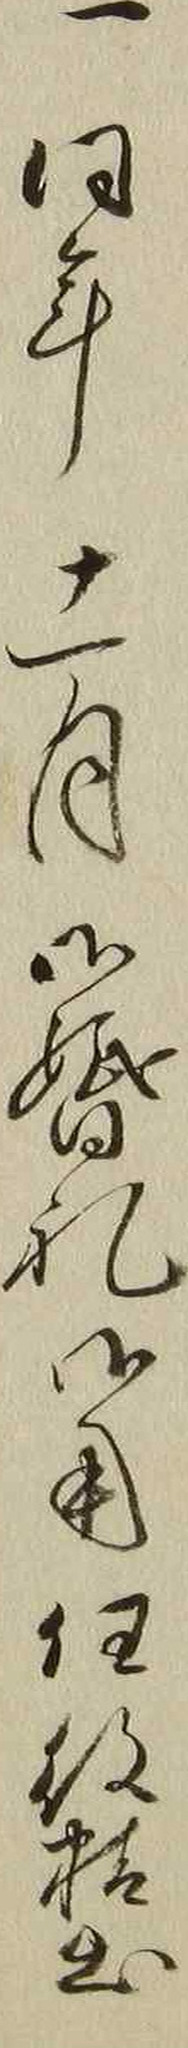一同年十一月御婚礼御用任役精出
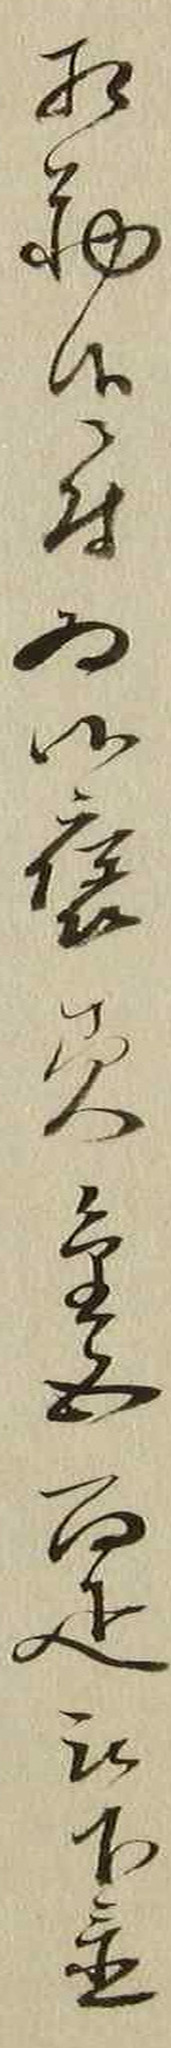相勤候ニ付為御褒美金五百疋被下置
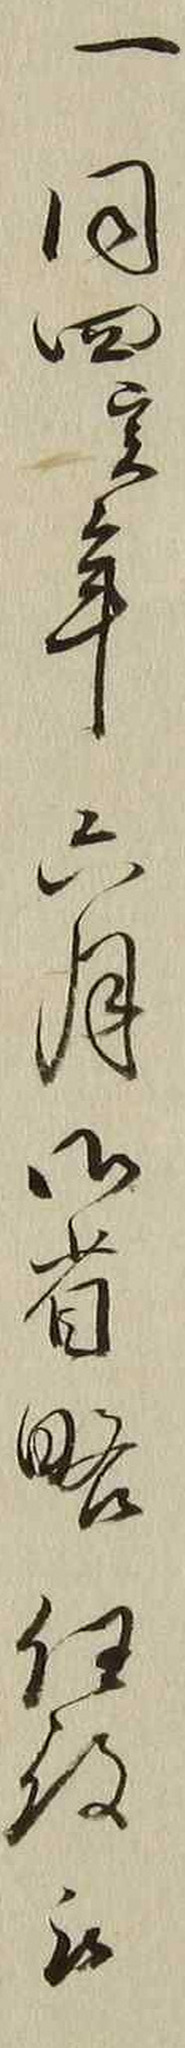一同四亥年六月御省略任役被
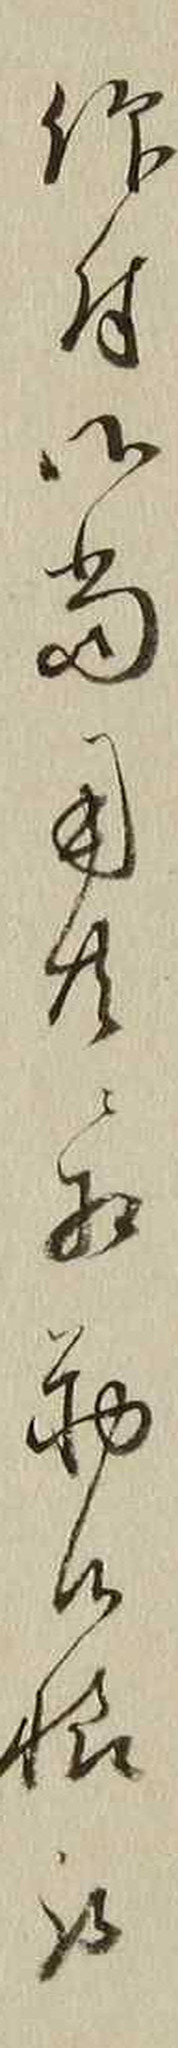仰付御番用共ニ相勤候様被
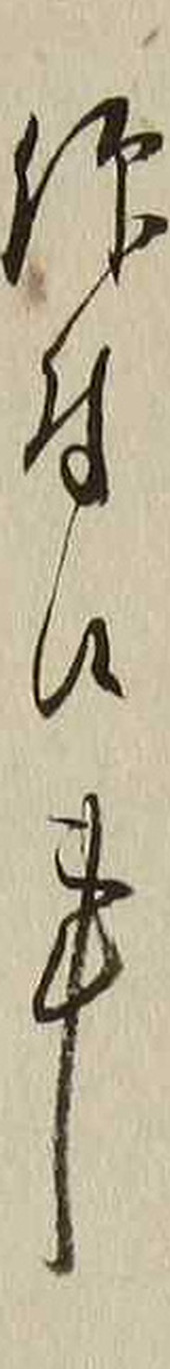仰付候事
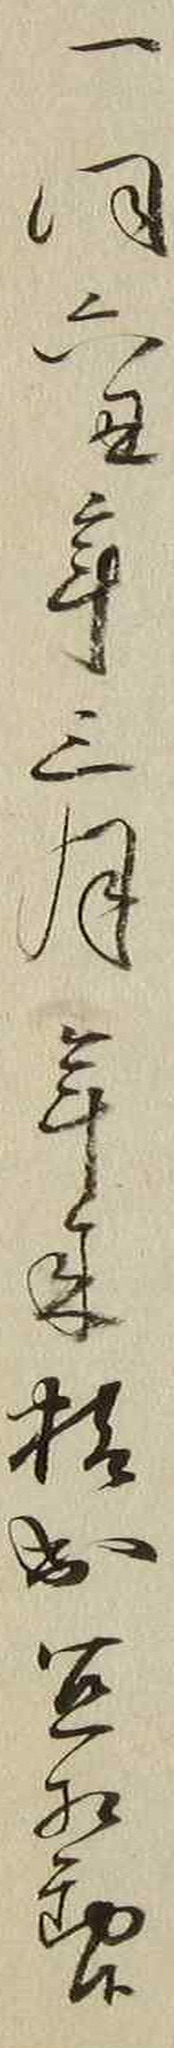一同六丑年三月年来精出宜相勤候
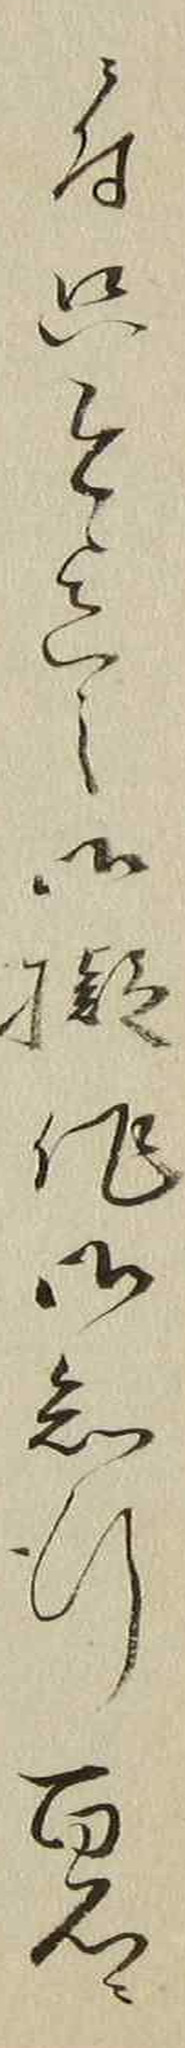ニ付只今迄之御擬作御知行百石ニ
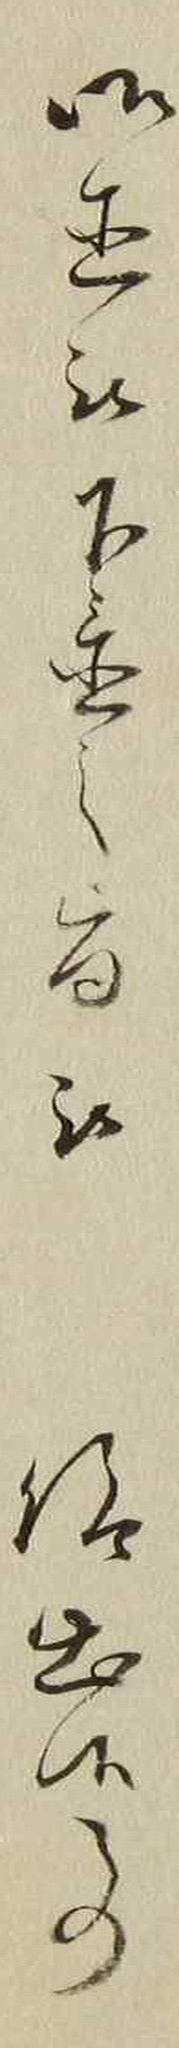御直被下置之旨被仰出候事
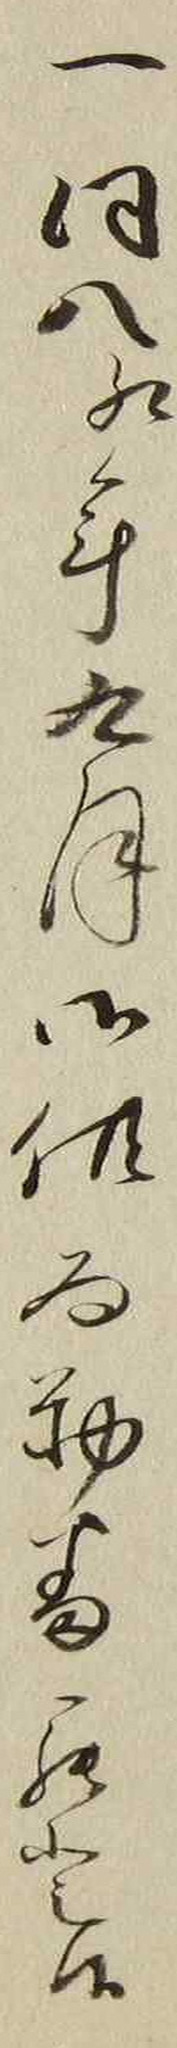一同八卯年九月御供為勤番罷登候
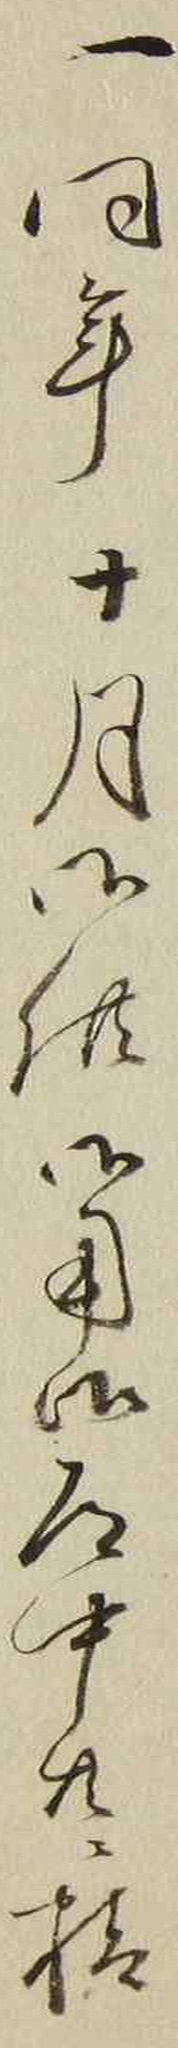一同年十月御供御用道中共ニ精
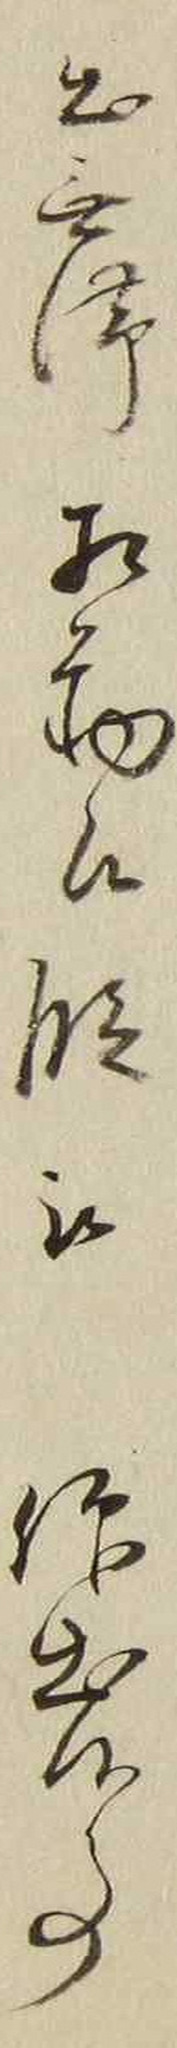出無滞相勤候段被仰出候事

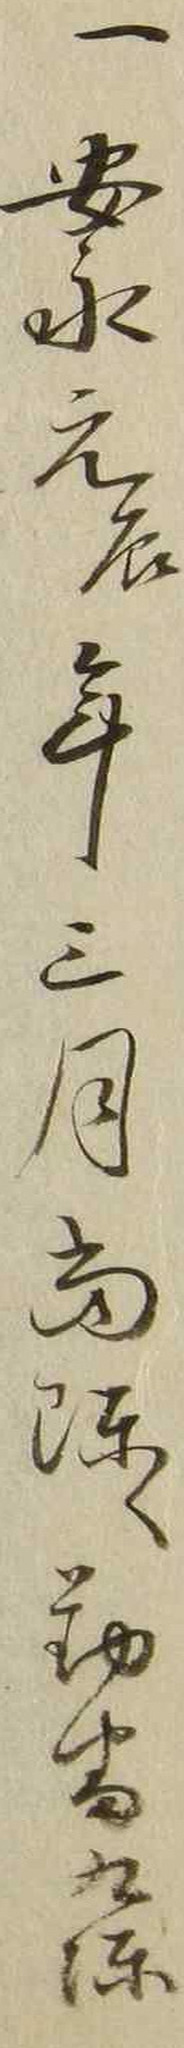一安永元辰年三月当陣へ勤番九陣
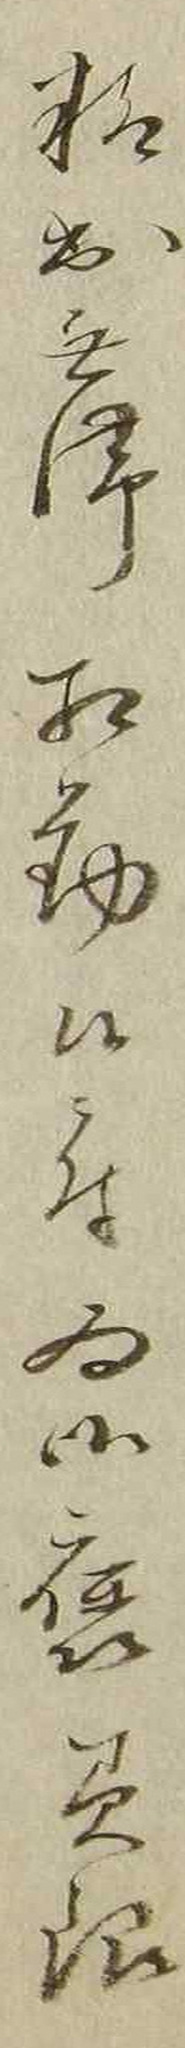精出無滞相勤候ニ付為御褒美銀
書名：諸士系譜　巻之52　に之部3
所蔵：会津若松市立会津図書館
